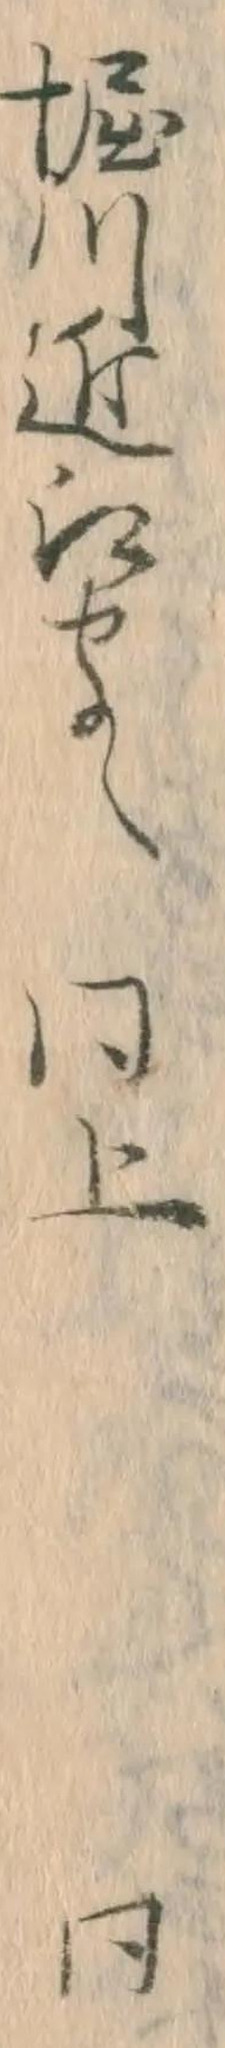堀川近江守へ同上同
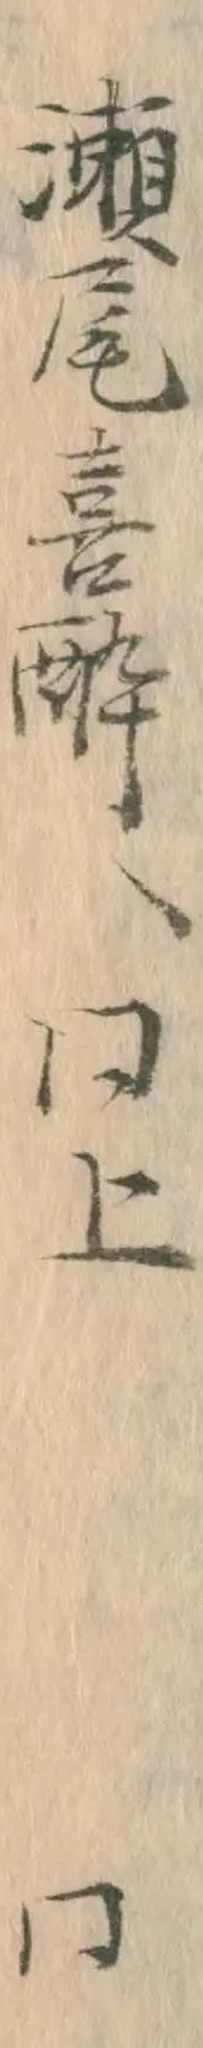瀬尾喜酔へ同上同
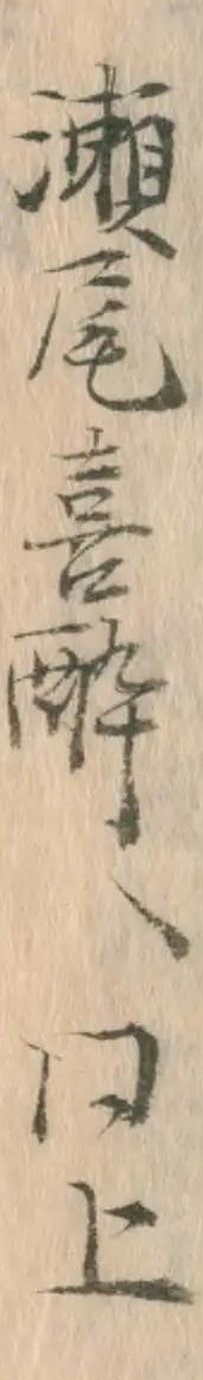瀬尾喜酔へ同上同
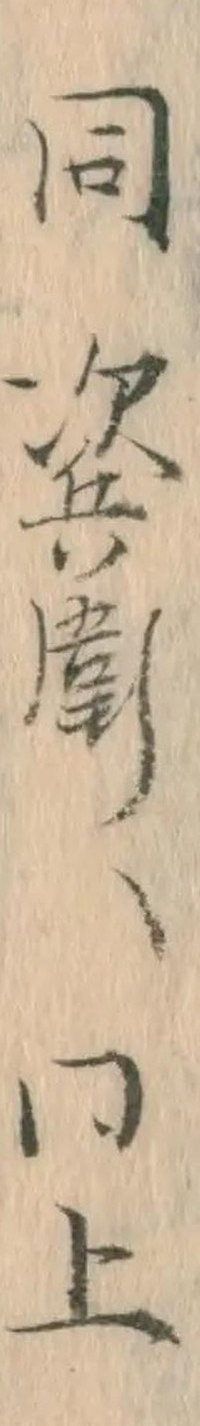同次兵衛へ同上同
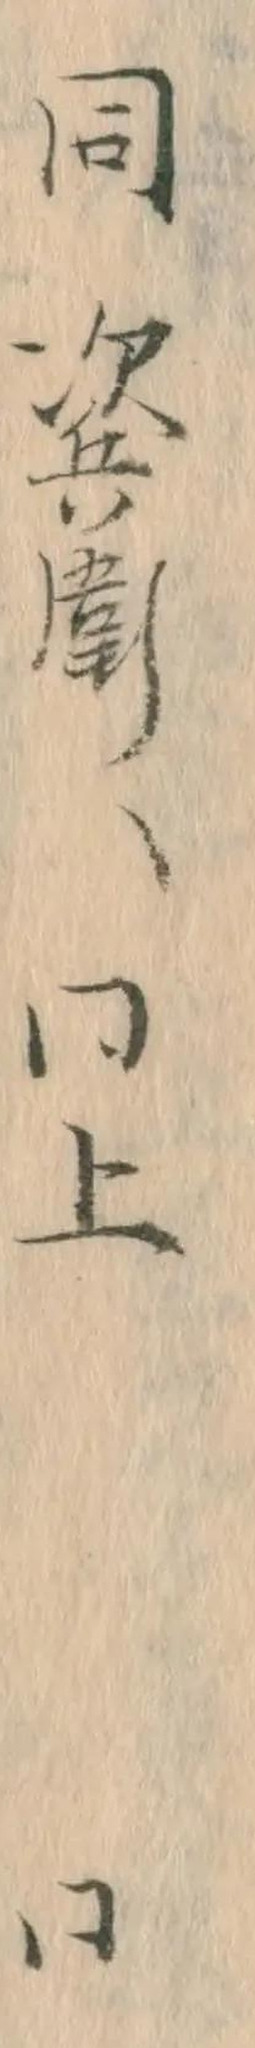同次兵衛へ同上同
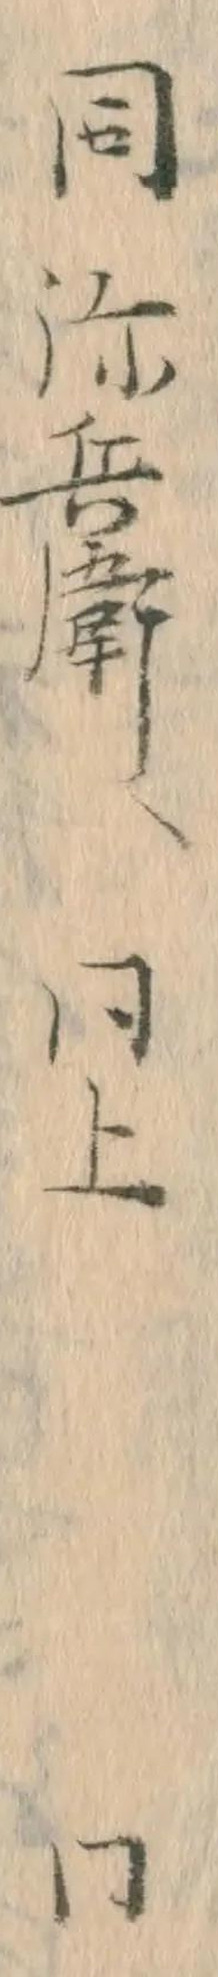同弥兵衛へ同上同
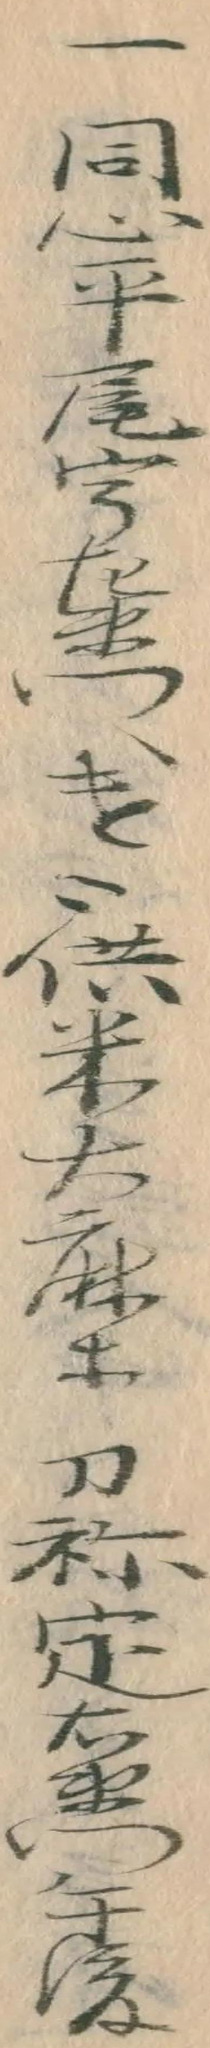一同心平尾宇左衛門へ遣御供米大麻等刀祢定右衛門午後
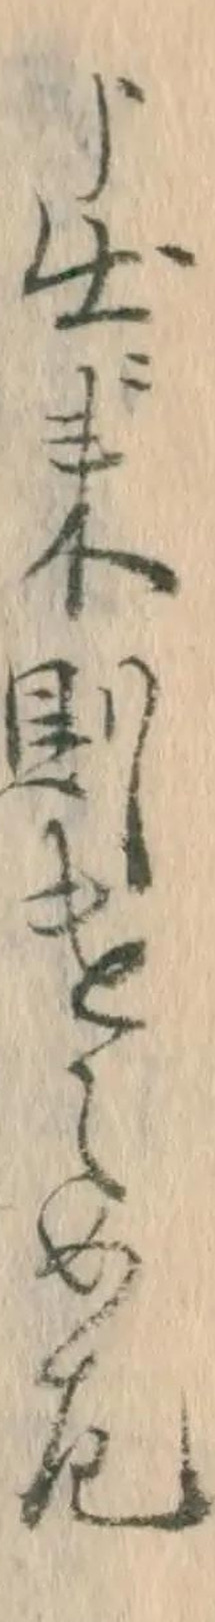申出ニ来則遣之如左

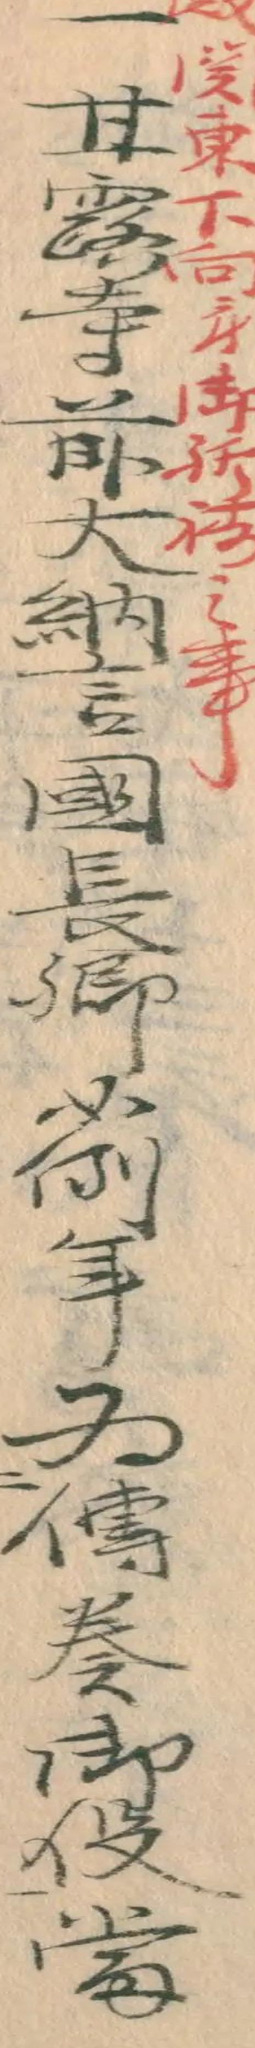一甘露寺前大納言國長卿如例年為傳奏御役當
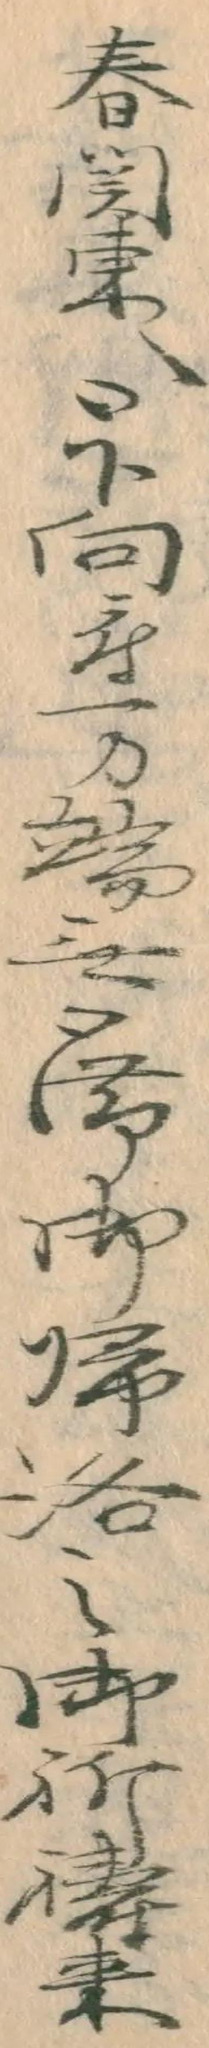春関東へ御下向ニ付万端無御滞御帰洛之御祈祷来
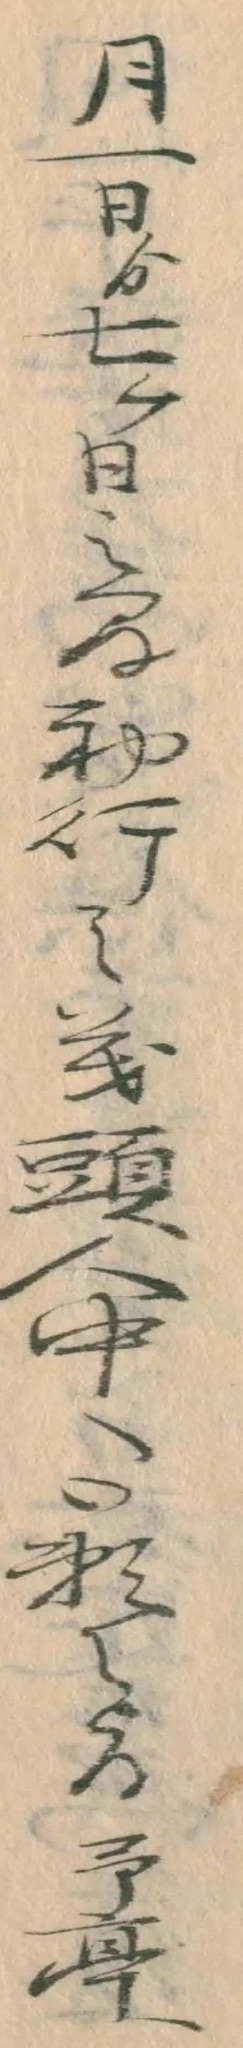月一日ゟ七ケ日之間勤行之義頭人中へ御頼之旨予亭ヘ
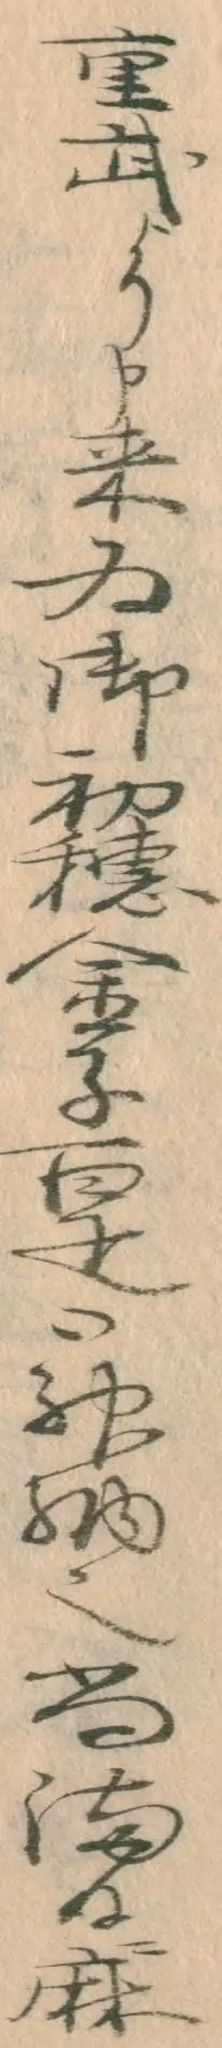重武より申来為御初穂金子百疋御神納也尚満日ニ麻
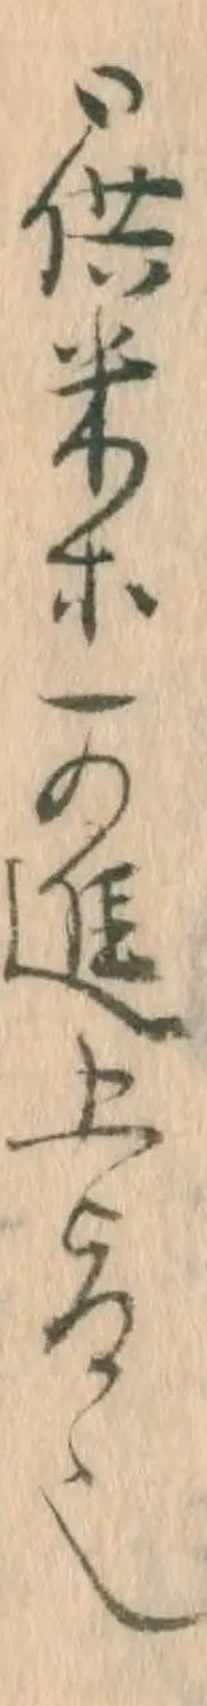御供米等可進上旨也
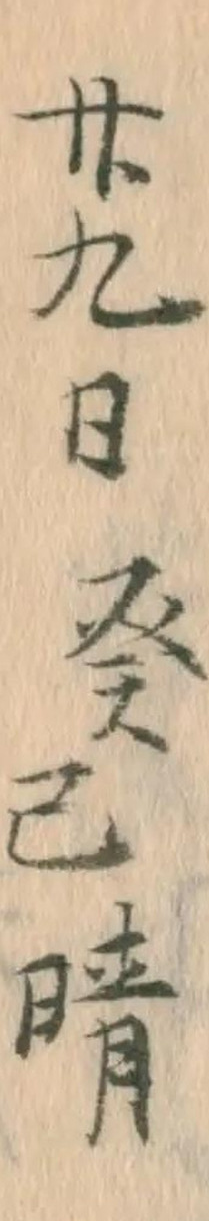廿九日癸巳晴
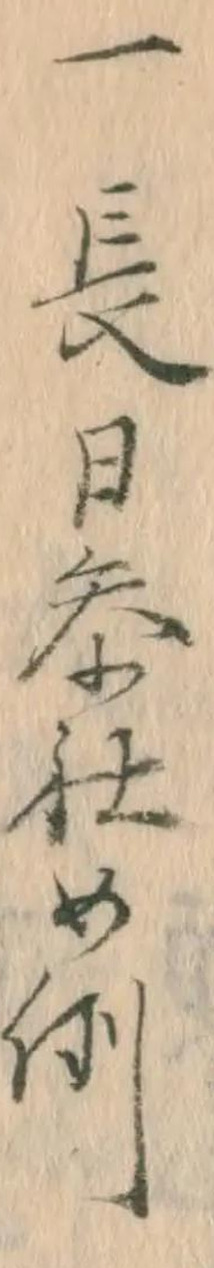一長日参社如例
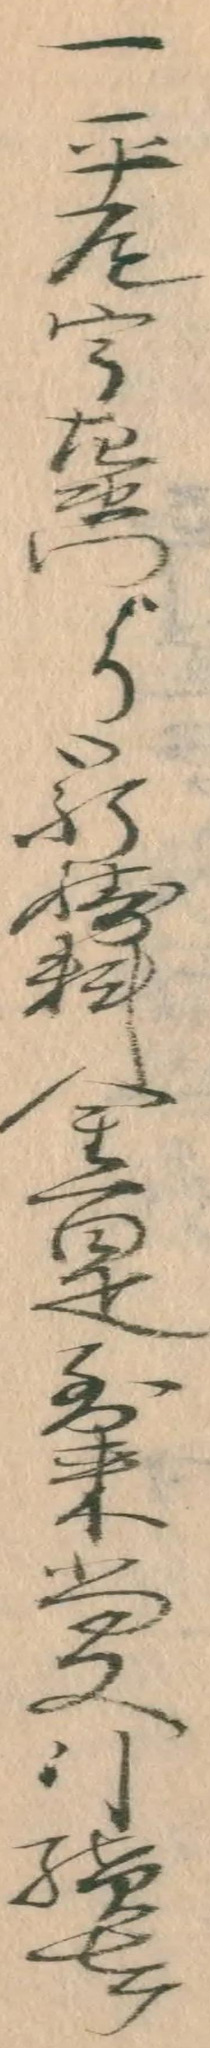一平尾宇左衛門より御祈祷料金百疋到来尚又引續七ヶ
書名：賀茂社記録. 第72冊
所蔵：国立国会図書館 National Diet Library, JAPAN
